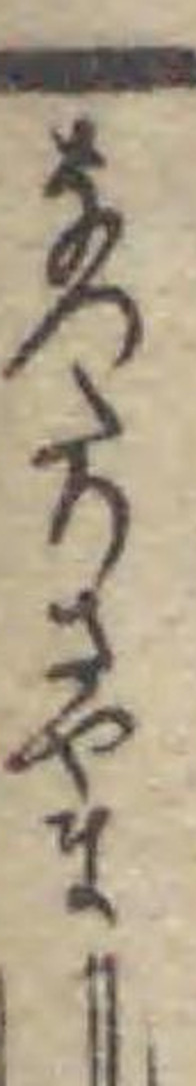なつたりさやまゝ
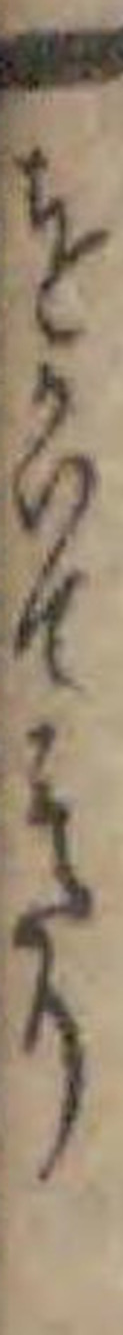をかいてみたり
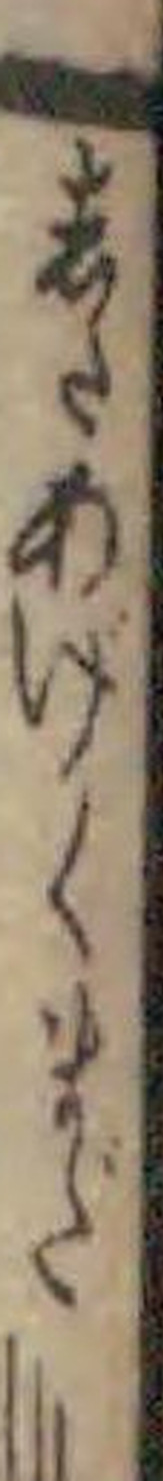したあげくまだ
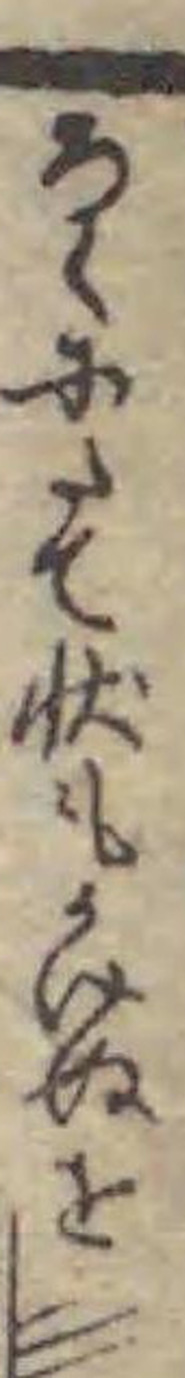ろくにたて状もかけぬを
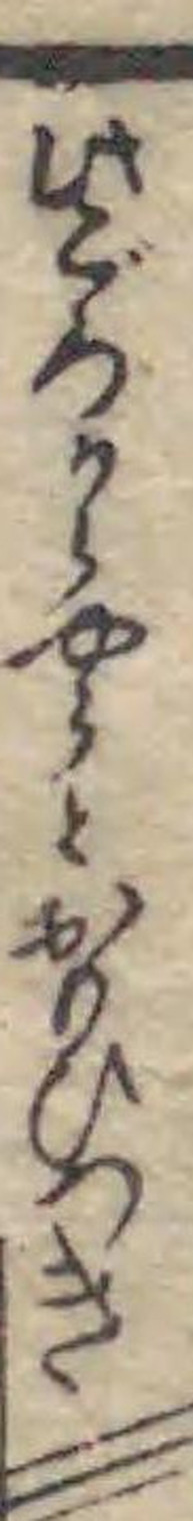此ごろからやうとおもひつき
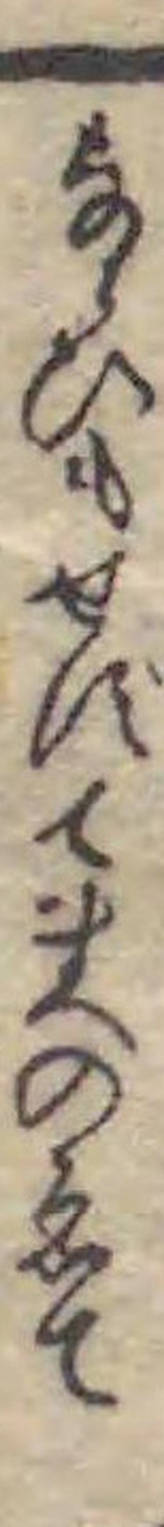ならひもせずてまへのゑて
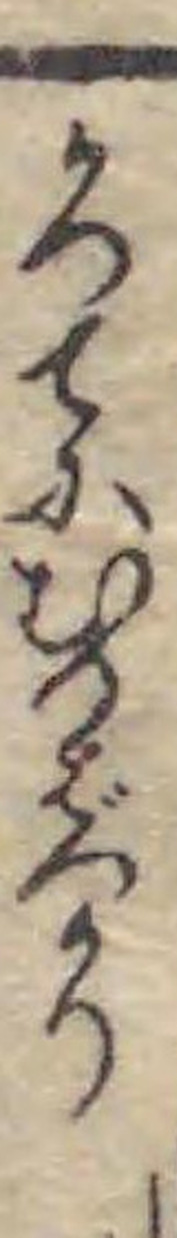かつてにむりばつかり
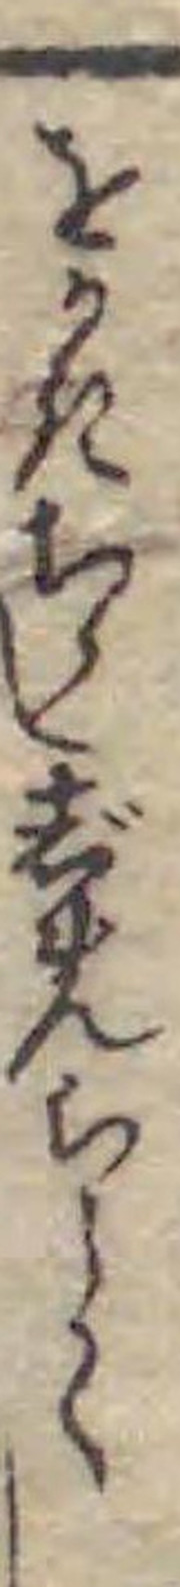をかきちらしじまんらしく
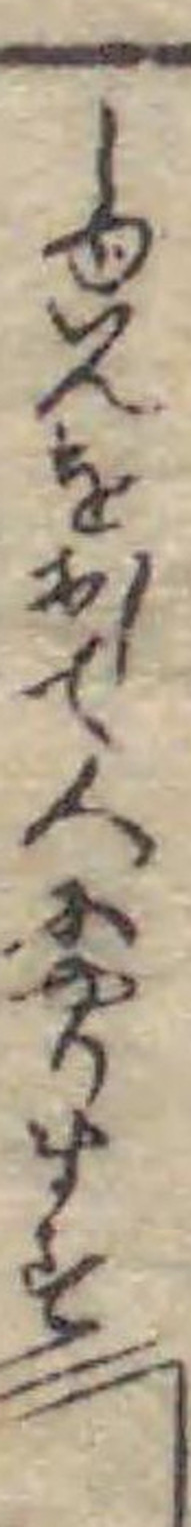しゆいんをおして人にやります
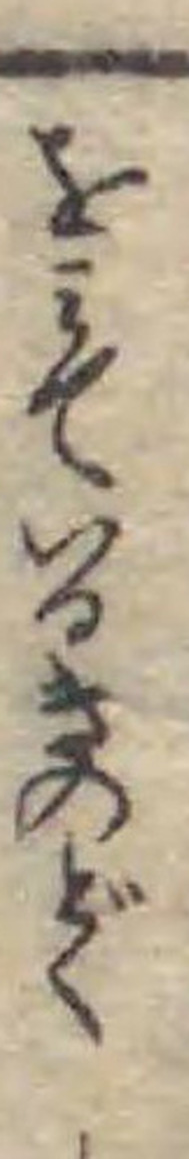をみているきのどく
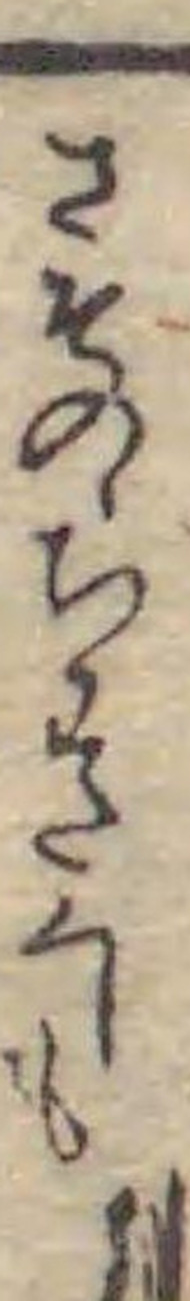さそのゝちわたくしも
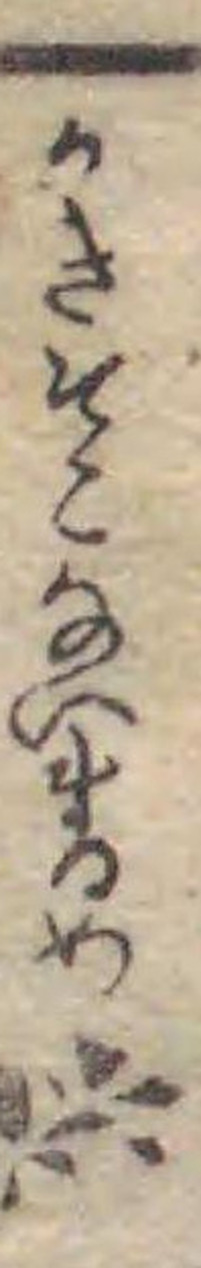かきそこないまるめ
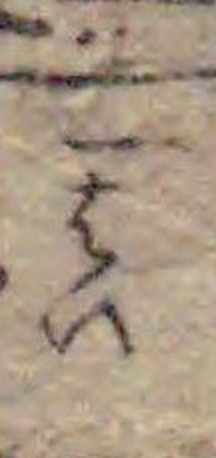一はい
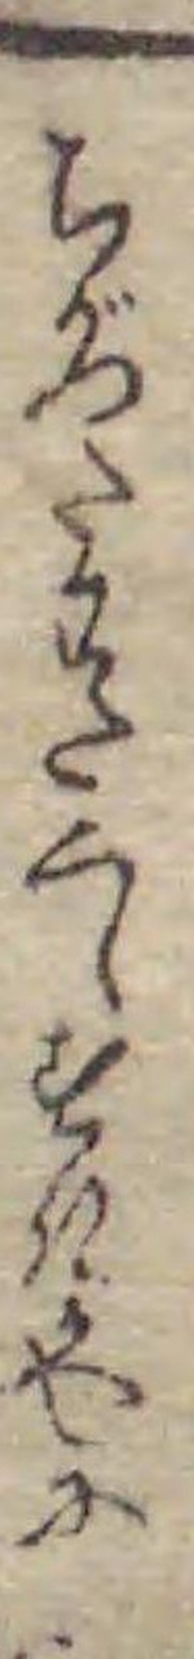ちがつたわたくしすきかへしに
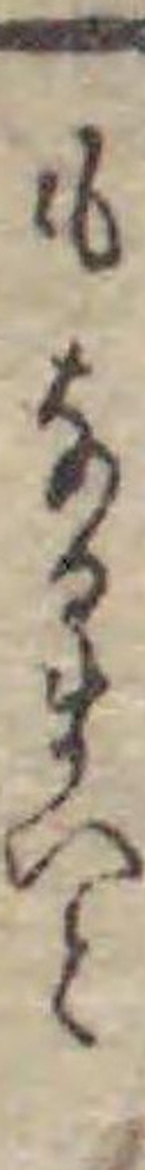もなるまいと
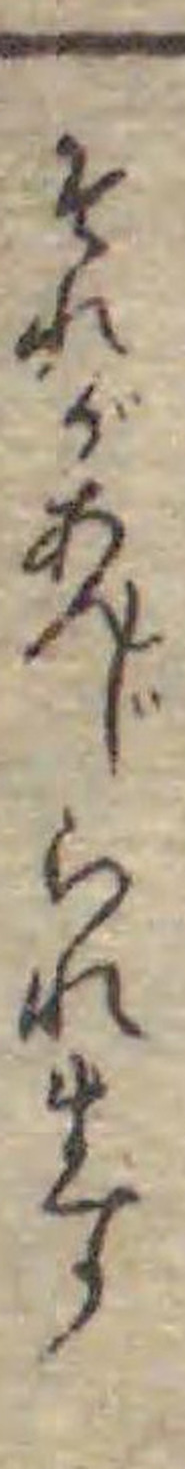それがあんじられます
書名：紙屑身上噺 : 3巻
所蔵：国立国会図書館 National Diet Library, JAPAN
